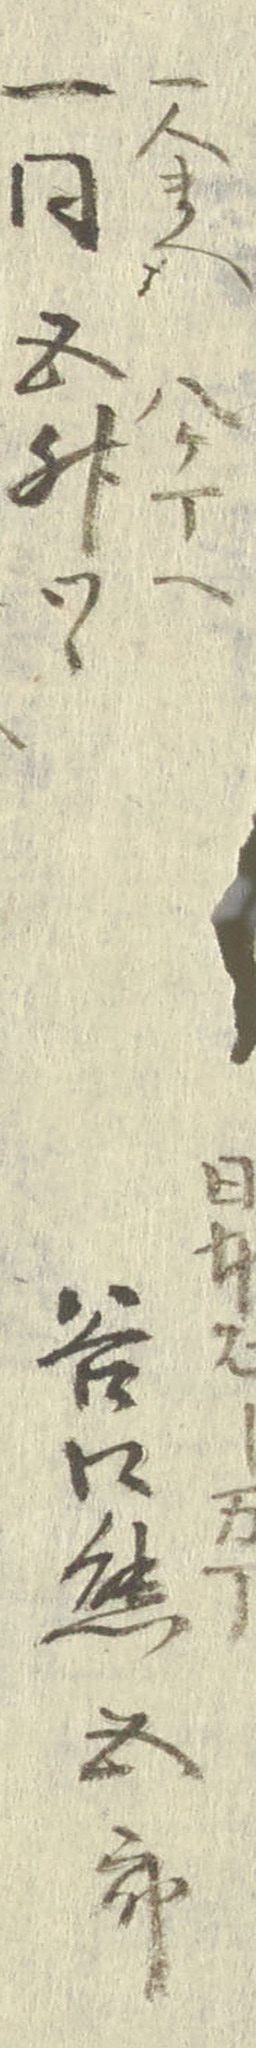一同五升ツヽ谷口熊五郎
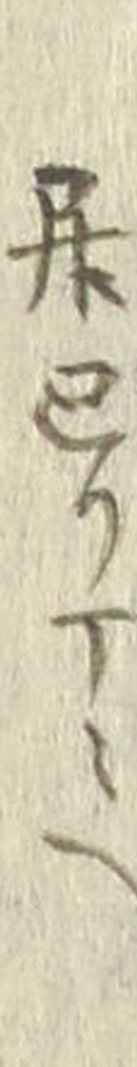居廻り丁〻へ
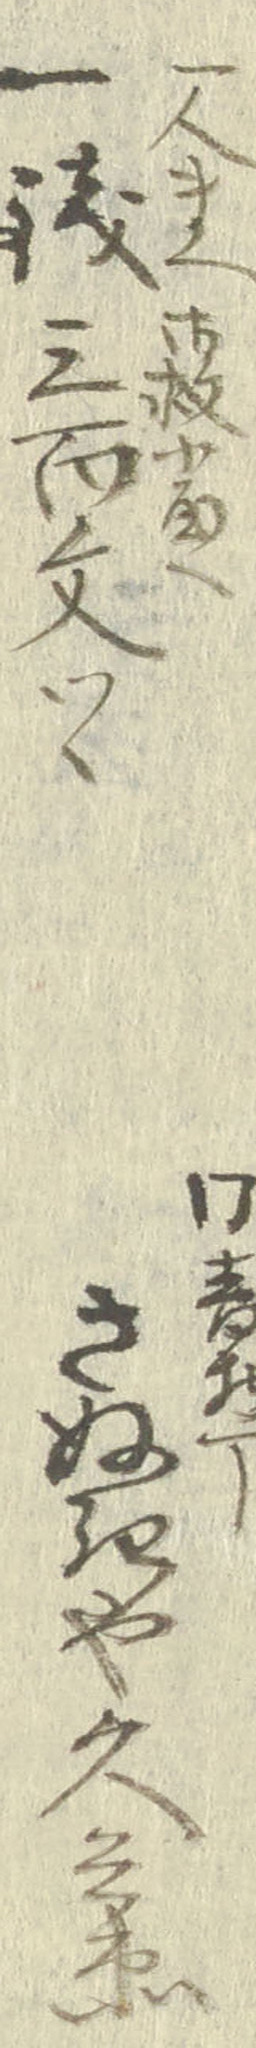一銭三百文ツヽさぬきや久兵衛
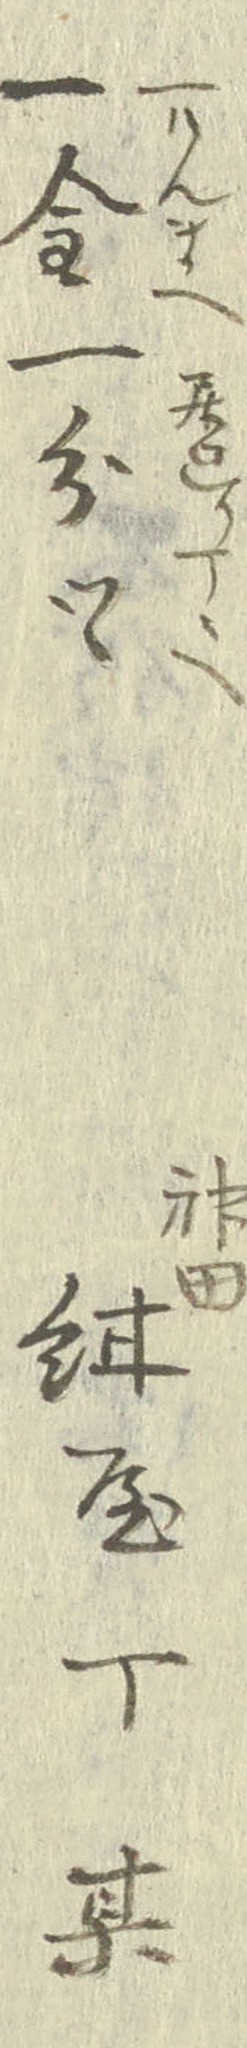一金一分ツヽ紺屋丁某
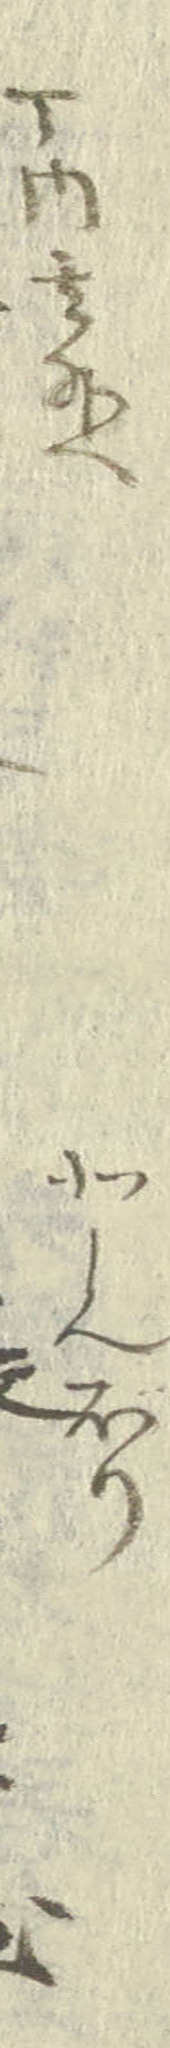丁内其外へ北しんぼり
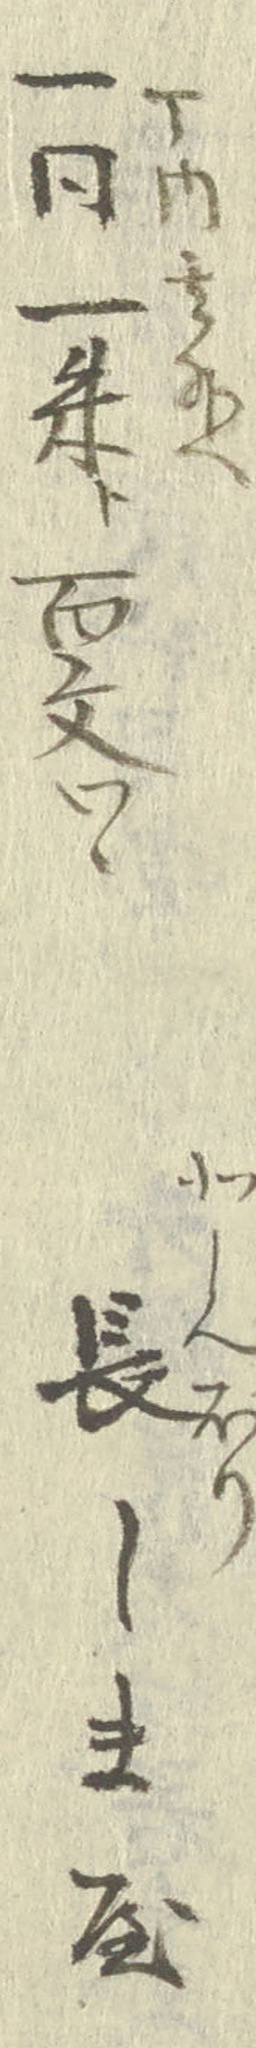一同一朱ト百文ツヽ長しま屋
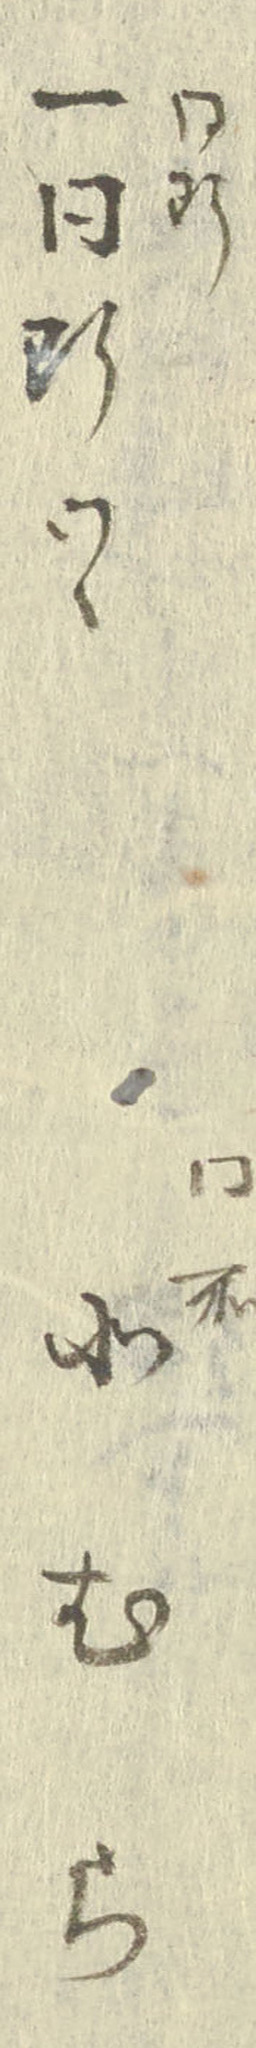一同断ツヽ北むら
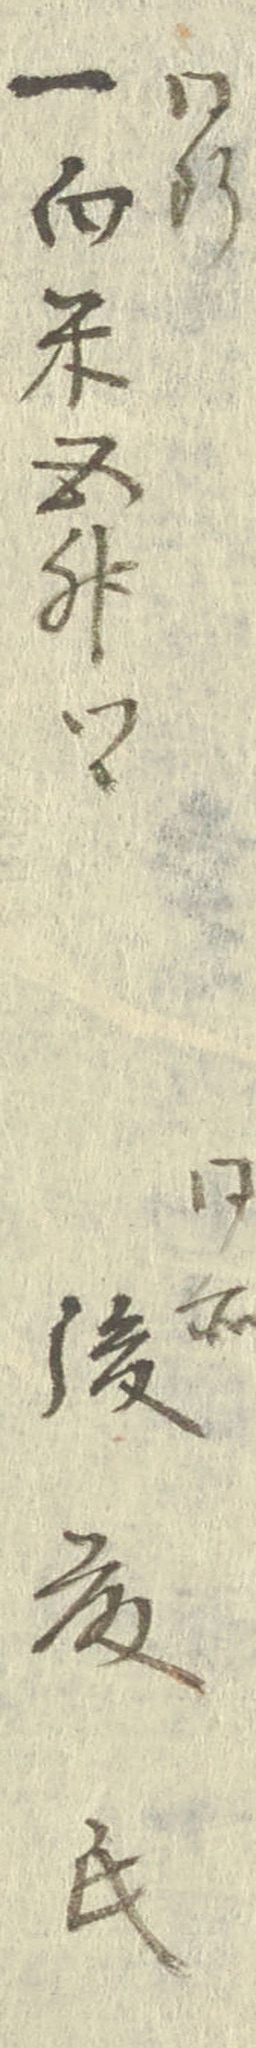一白米五升ツヽ後藤氏
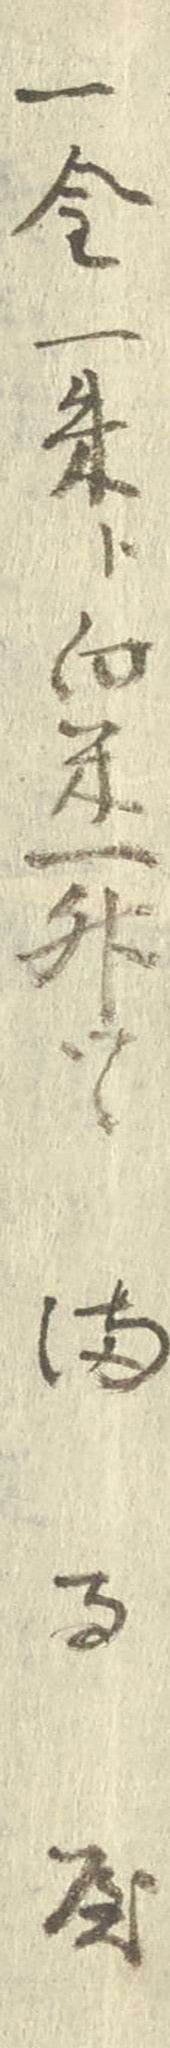一金一朱ト白米一升ツヽまる屋
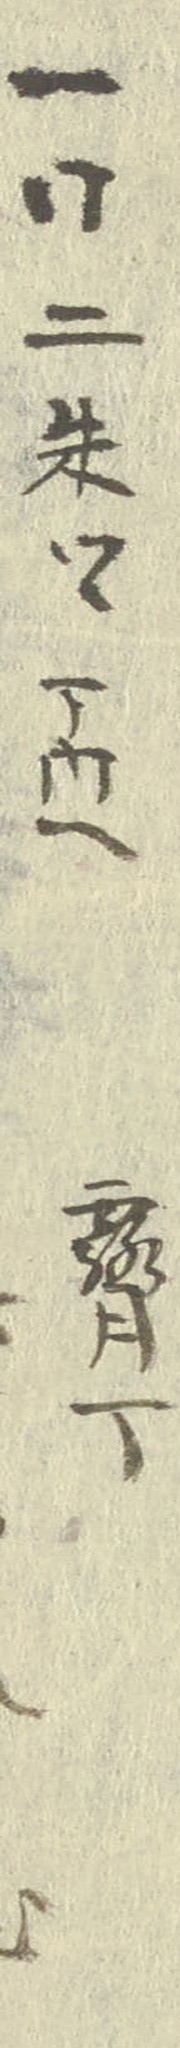一同二朱ツヽ丁内へ露月丁
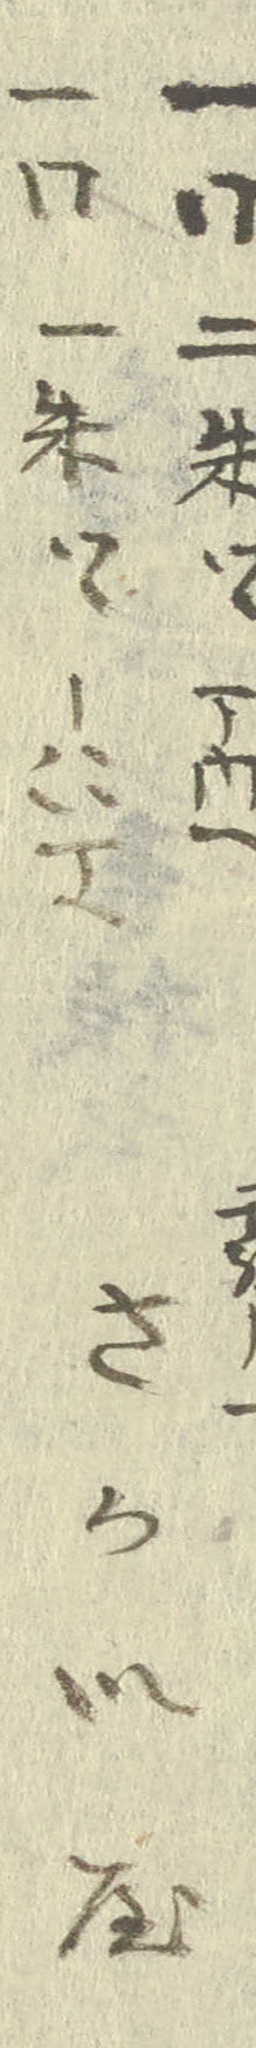一同一朱ツヽしハい丁へさかい屋
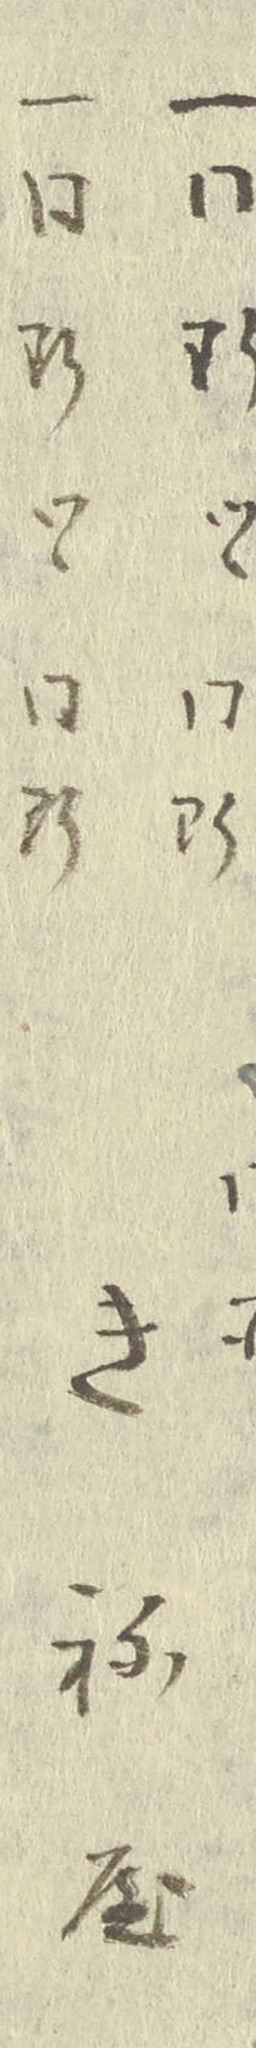一同断ツヽ同断きね屋
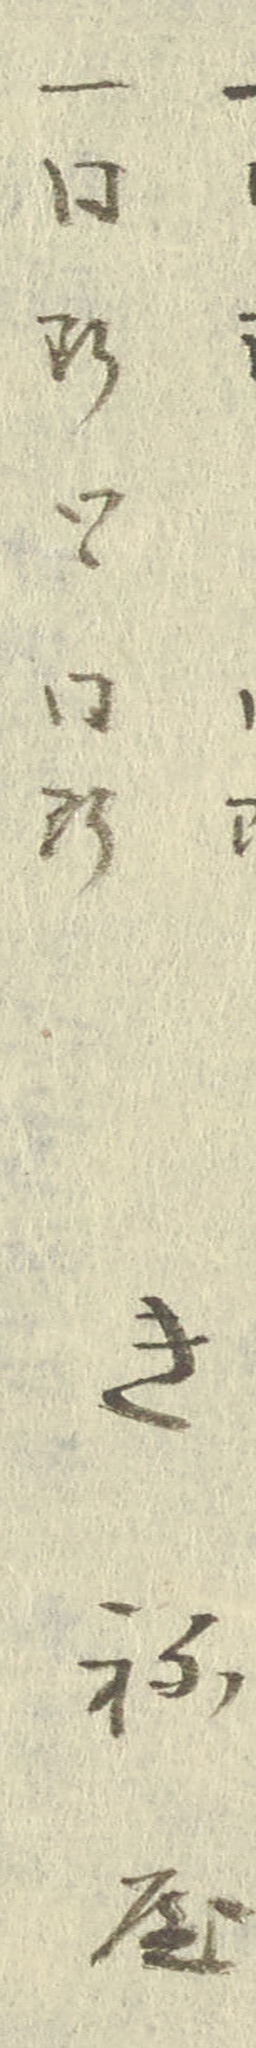一同断ツヽ同断きね屋
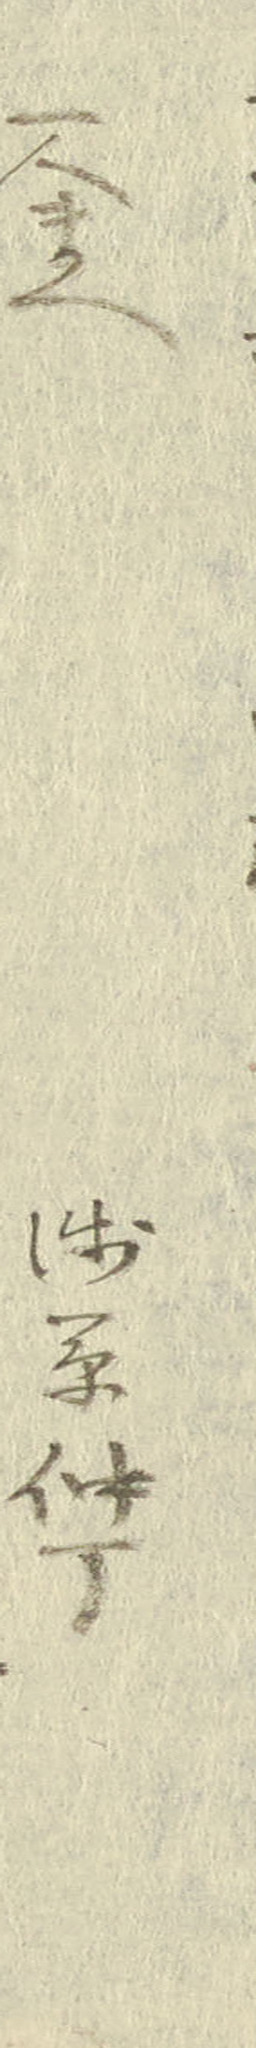一人まへ浅草仲丁
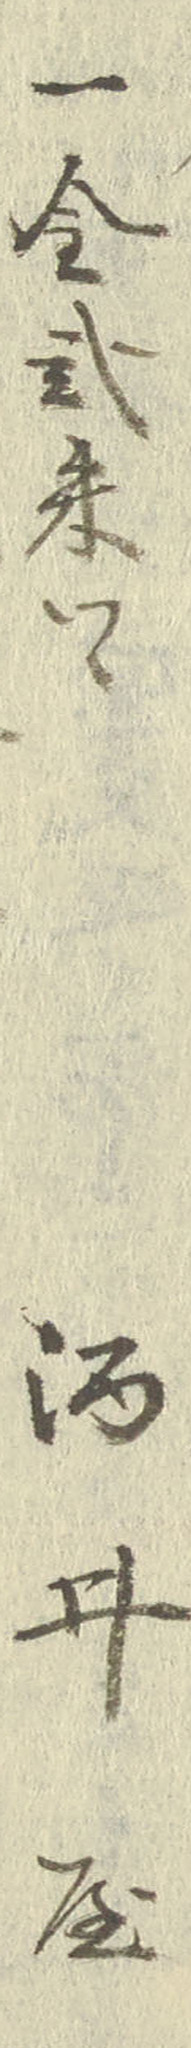一金弐朱ツヽ酒井屋
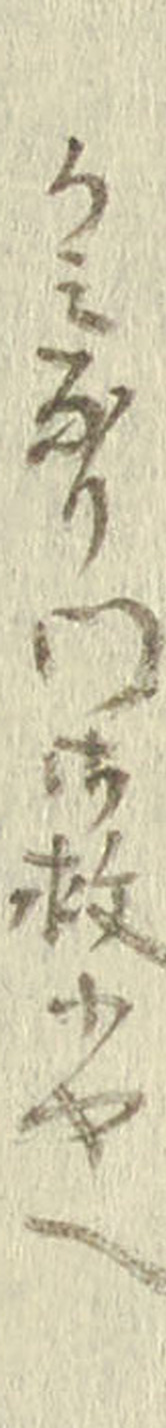かミなり門御救小ヤへ
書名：御府内御屋敷方市中共地震類焼場所明細書之冩兼街道筋近郷聞書
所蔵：東京大学総合図書館 General Library in the University of Tokyo, JAPAN
